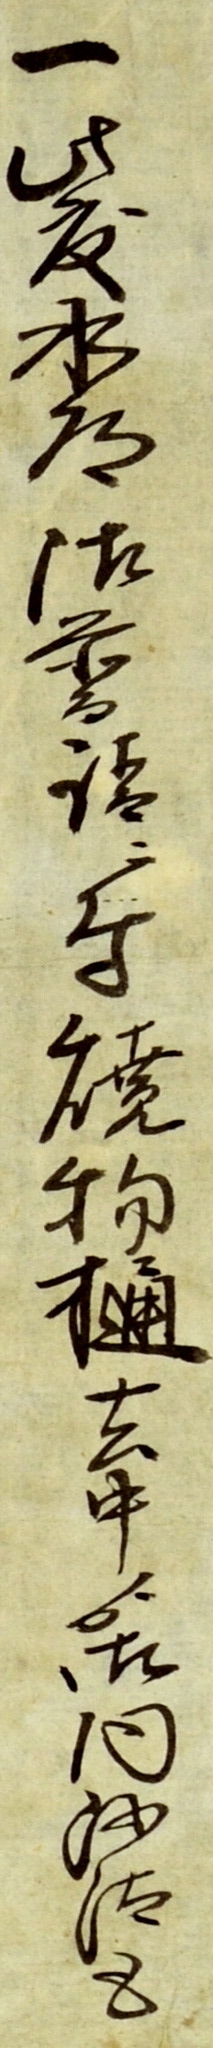一此度水道御普請ニ付焼物樋去中ヨリ御内沙汰も
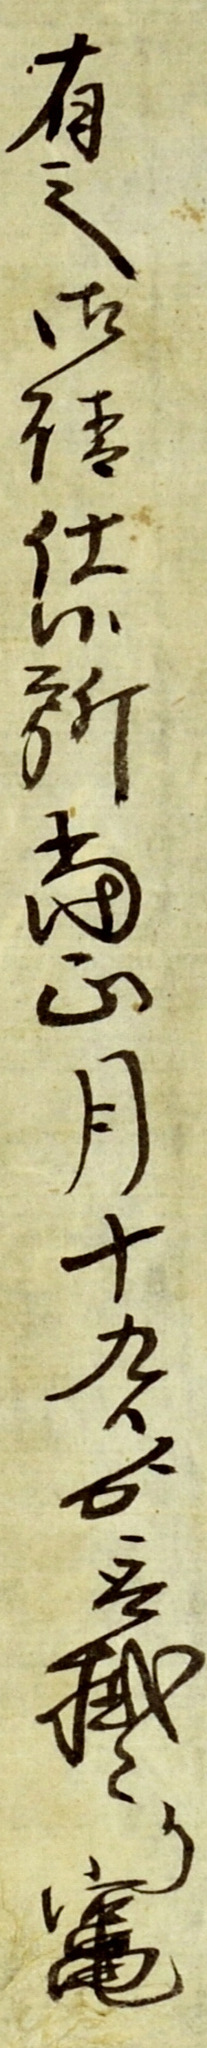有之御請仕候所当正月十九日ヨリ取掛り竃
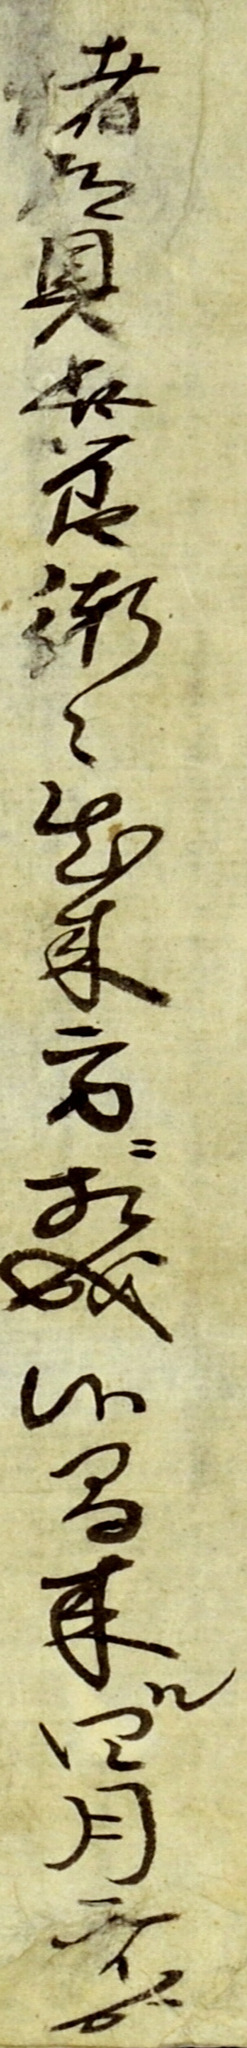諸道具此節漸々出来方ニ相成候間来ル四月三日ヨリ
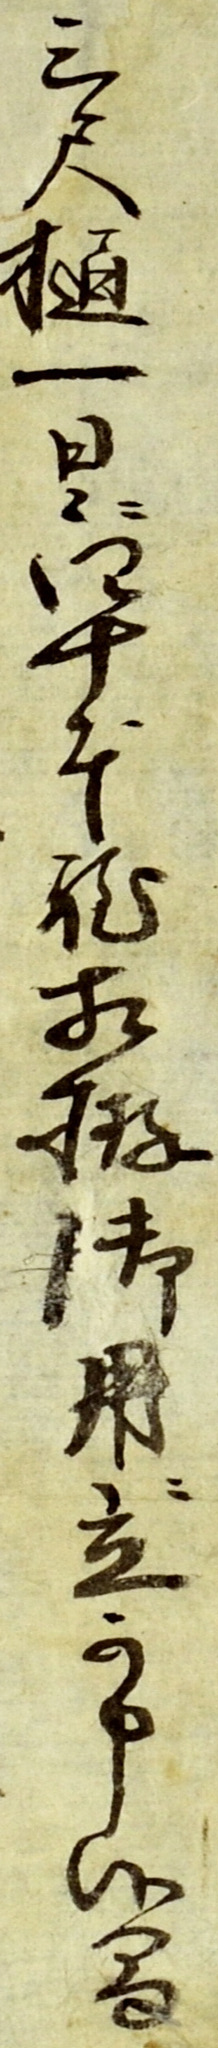三尺樋一日〱ニ四十本程相拵御用ニ立可申候間
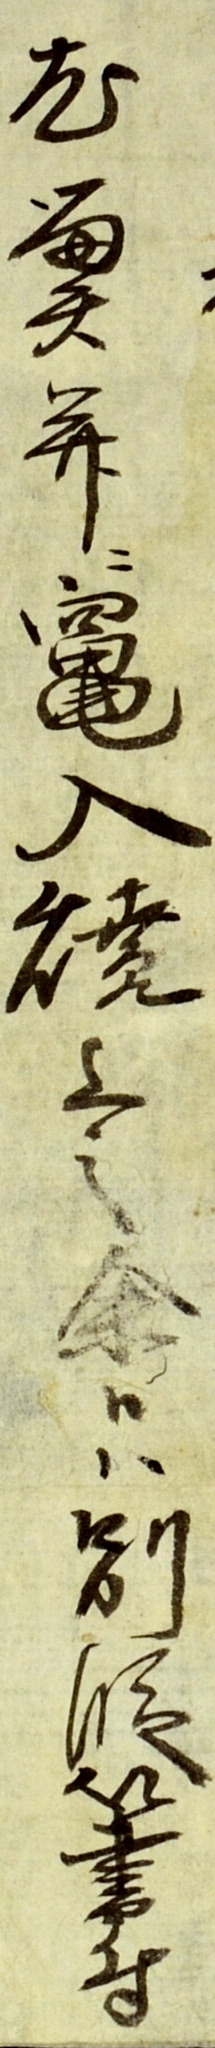尤留弁ニ竃入焼上之余口ハ別段以書付
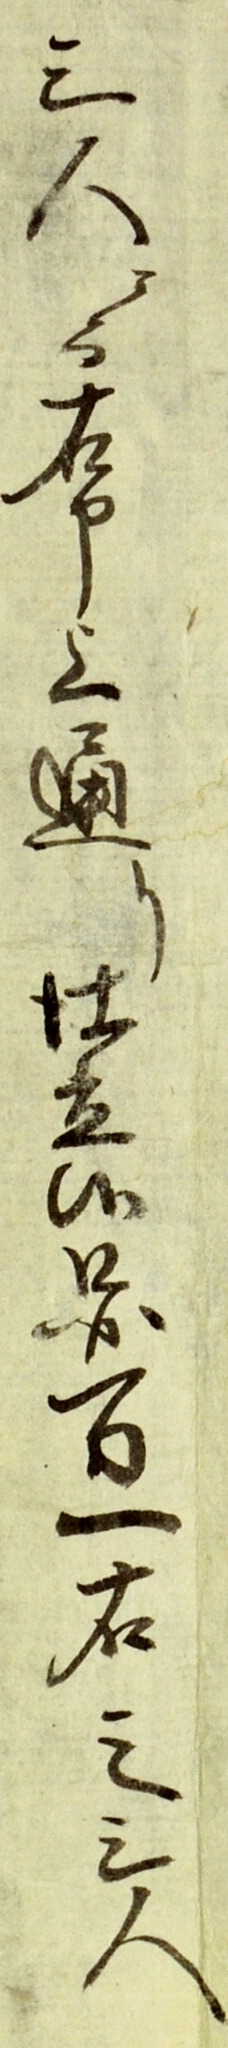三人ニ而右申上通り仕立候図万一右之三人
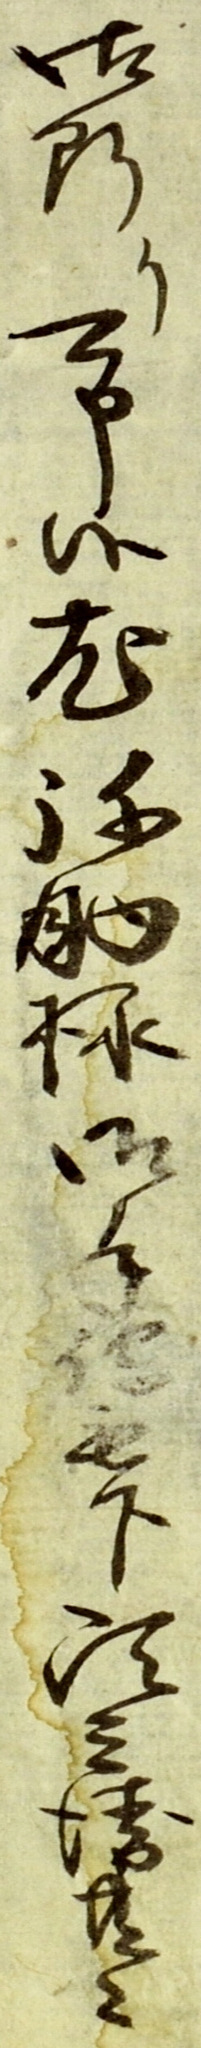御断り可申候尤弥助様御手伝被下次兵衛共々
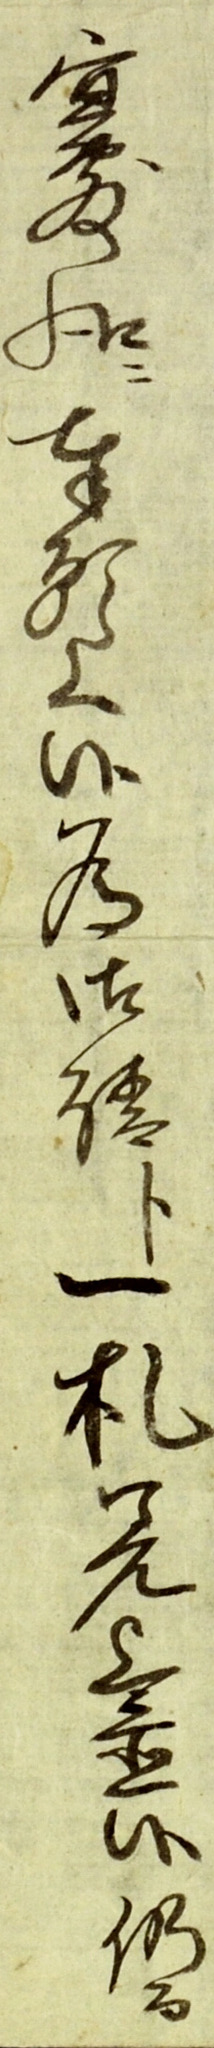宜敷様ニ奉願上候為御請ト一札差上置候仍而
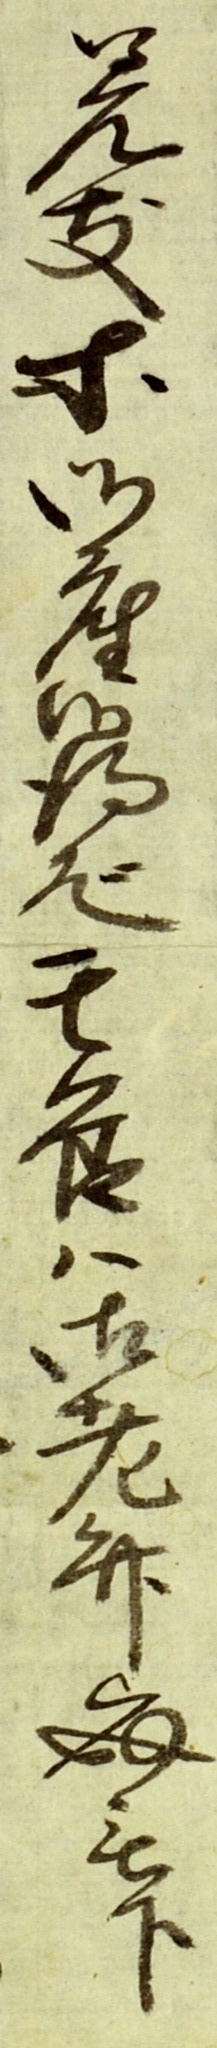差支等御座候得ば其節ハ御老弁被成被下
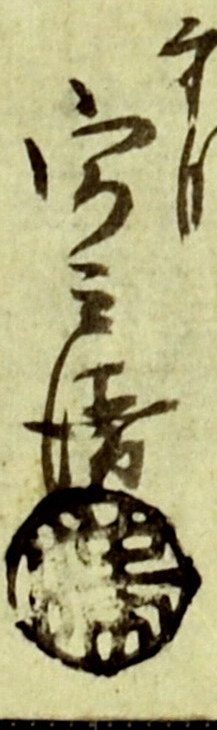宇兵衛㊞
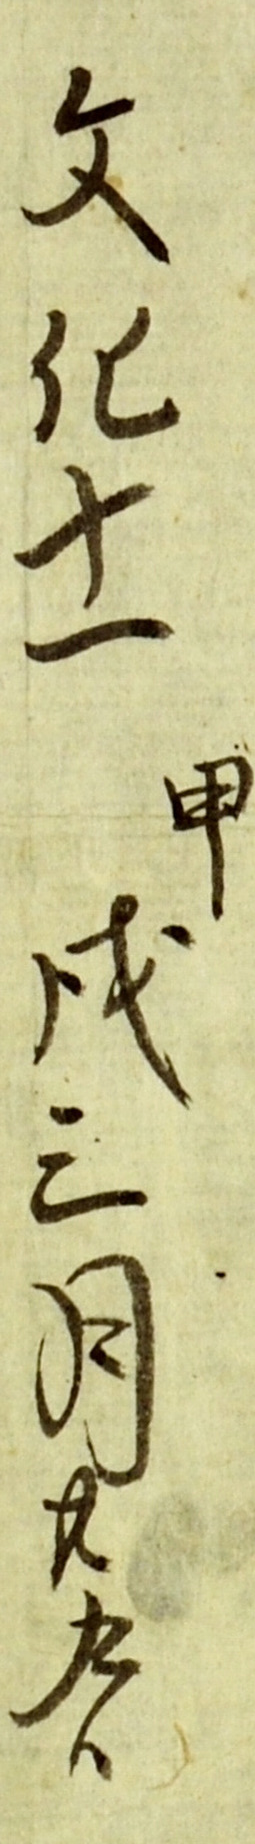文化十一甲戌三月廿九日
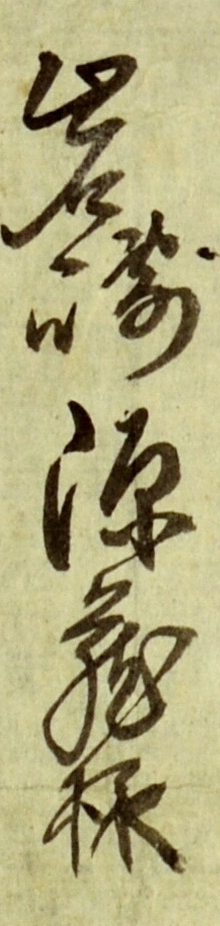岩崎源蔵様
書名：乍恐差上一札之事
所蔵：伊那市立高遠町図書館・合同会社AMANE
